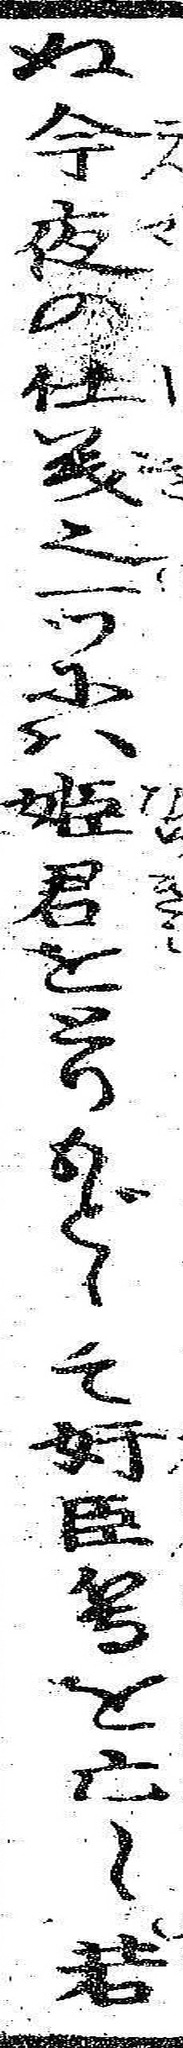ぬ今夜の仕義也。一ツには姫君をとりもどして奸臣等を亡し。若
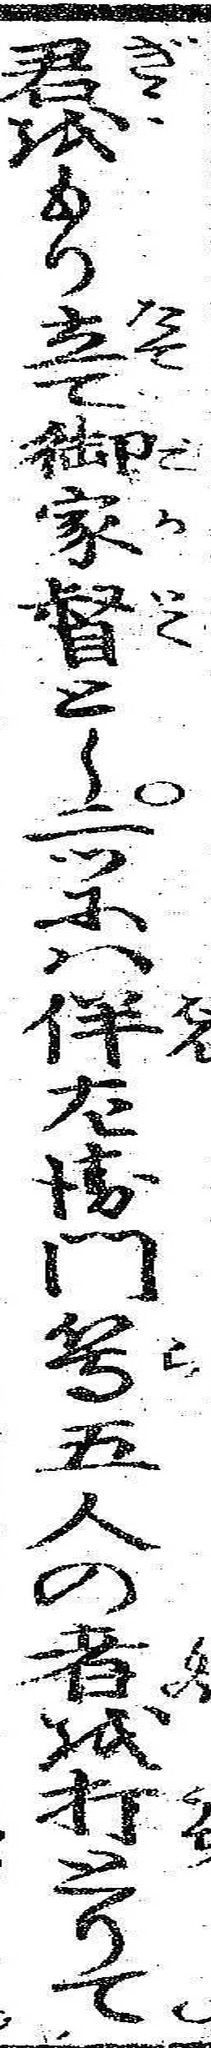君をもり立て御家督とし。二ツには伴左衛門等五人の者を打とりて。
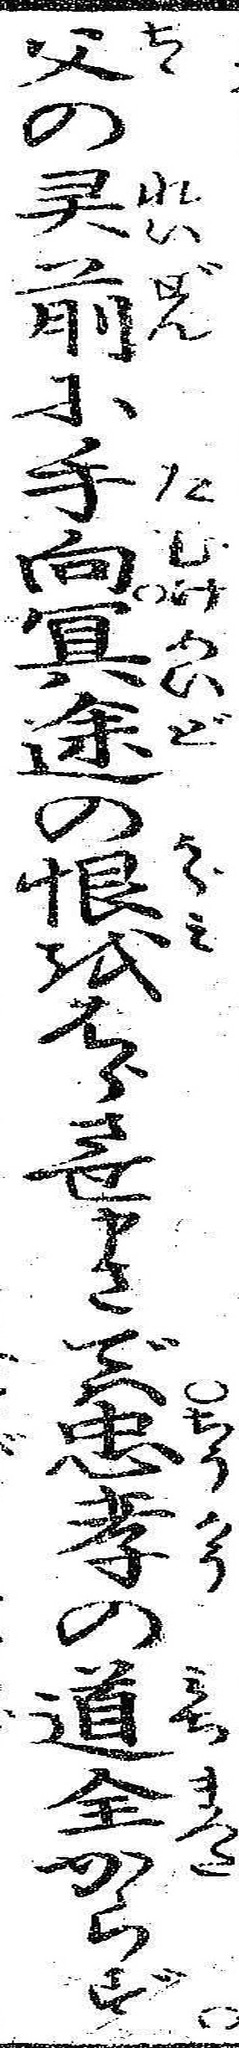父の霊前に手向。冥途の恨をはらさせ申さでは。忠孝の道全からず。
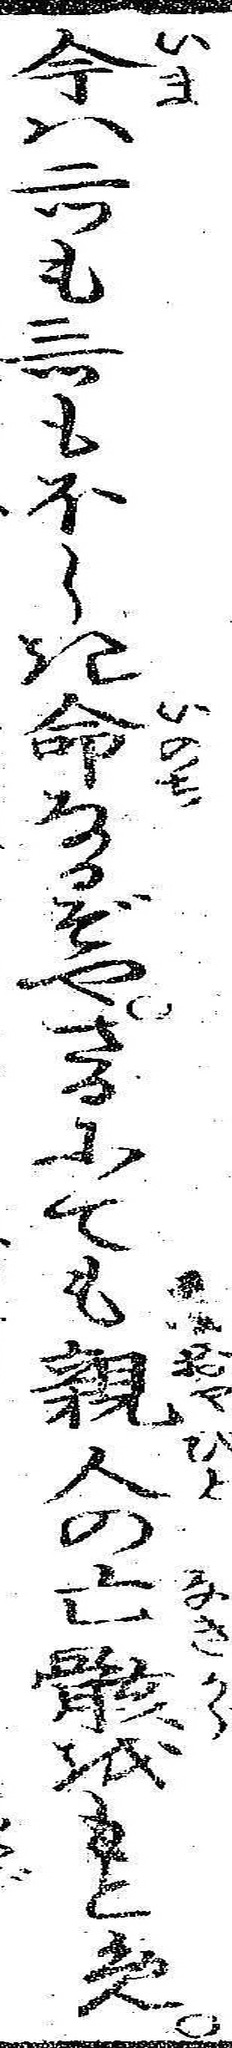今は二つも三つもほしき命なるぞや。さるにても親人の亡骸をもとめ。
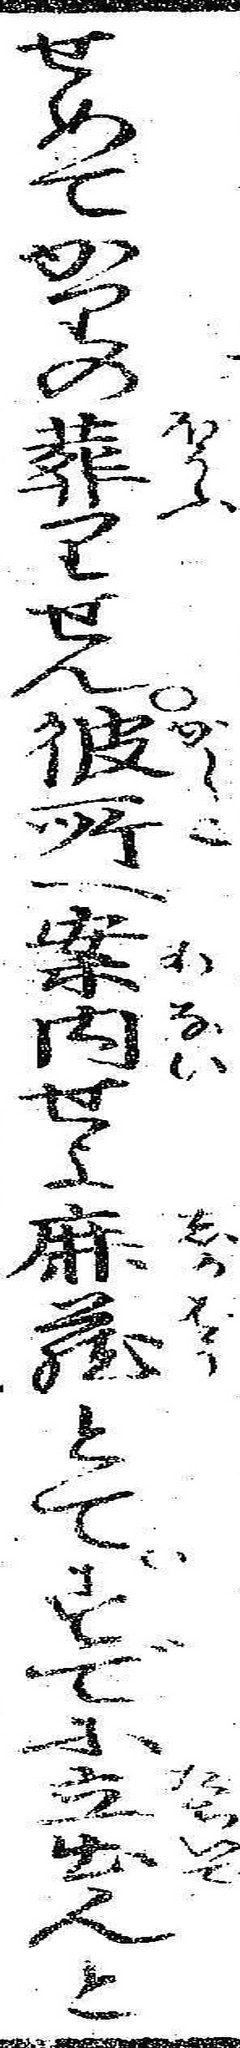せめてかりの葬りせん。彼所へ案内せよ鹿蔵とて。すでに立出んと
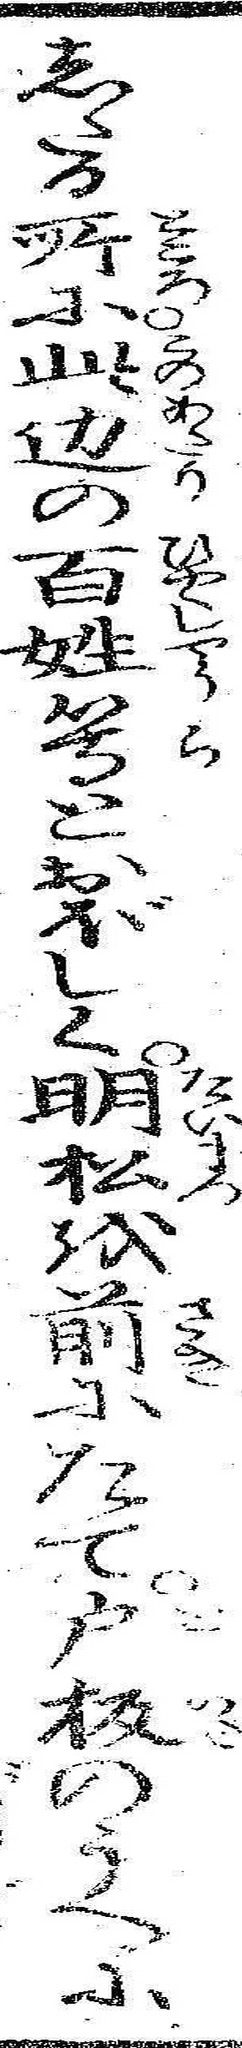したる所に。此辺の百姓等とおぼしく。明松を前にたて。戸板のうへに
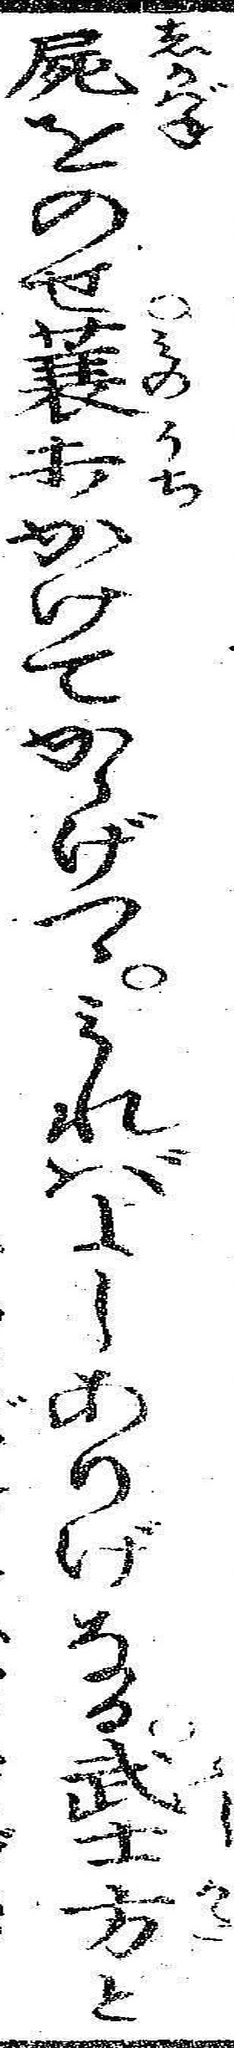屍をのせ。蓑打かけてかゝげつゝ。みればよしありげなる。武士方と
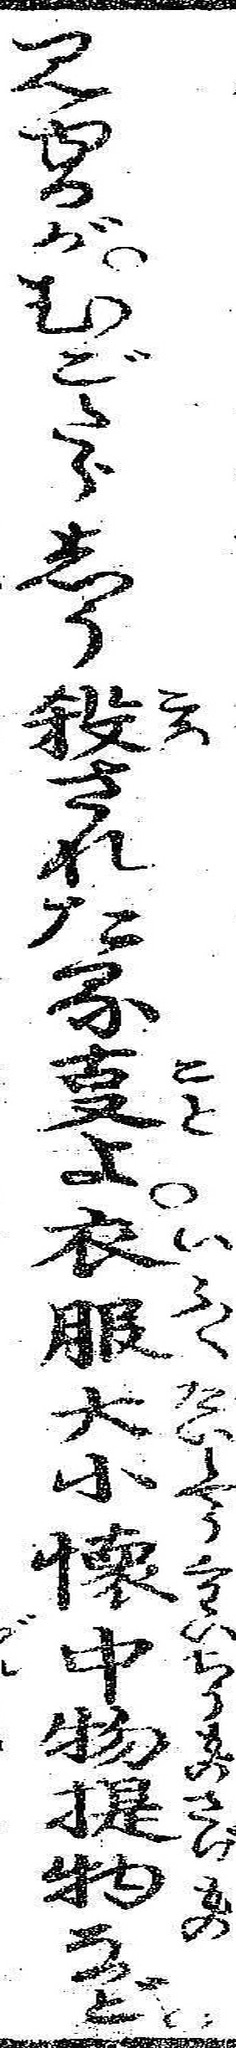見ゆるが。むごたらしう殺されたる事よ。衣服大小懐中物提物など。
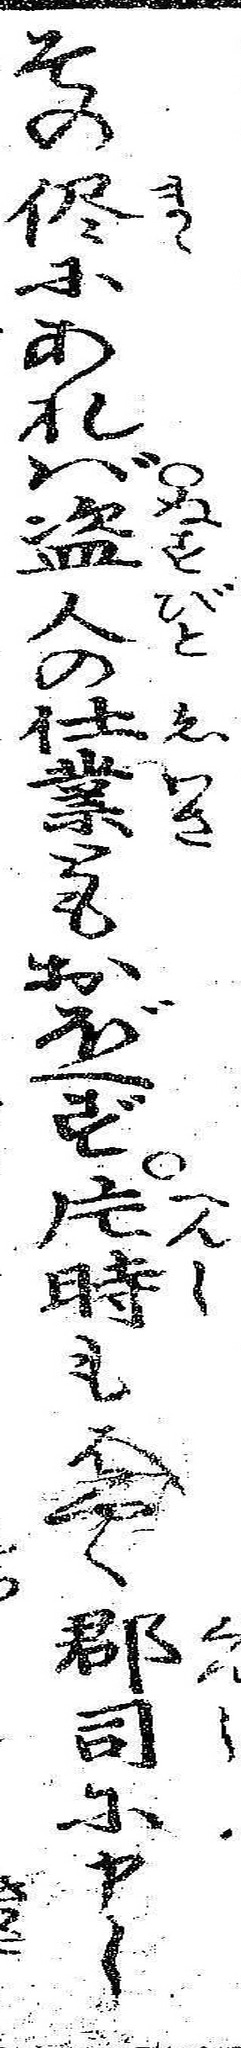その侭にあれば。盗人の仕業ともおぼへず。片時もはやく郡司に申し
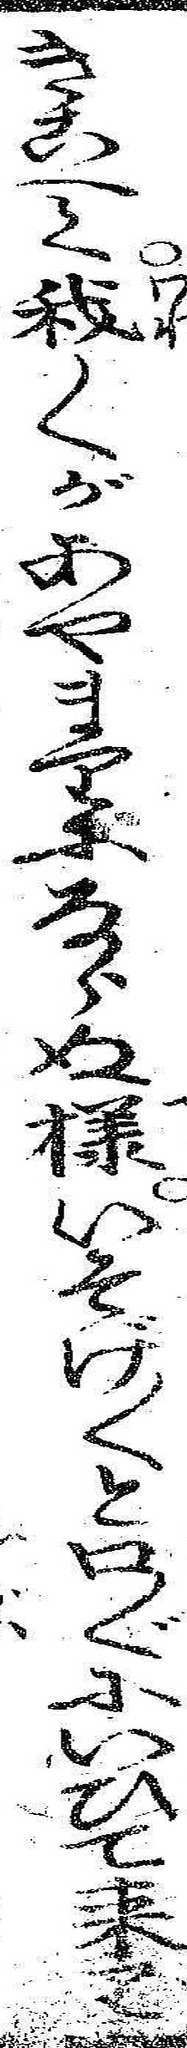きこへて。我々があやまりにならぬ様。いそげ〳〵と口〴〵にいひて来り
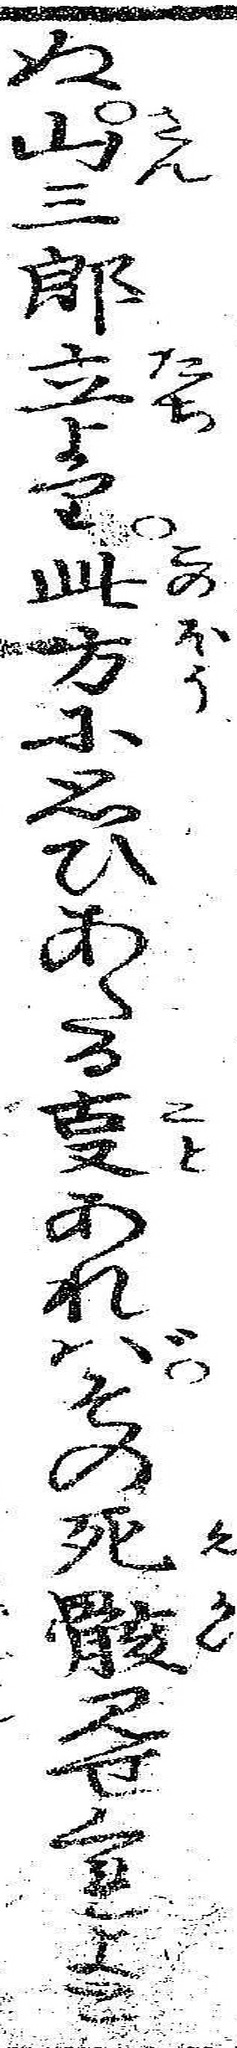ぬ。山三郎立より。此方に思ひあたる事あれば。その死骸見せくれよと
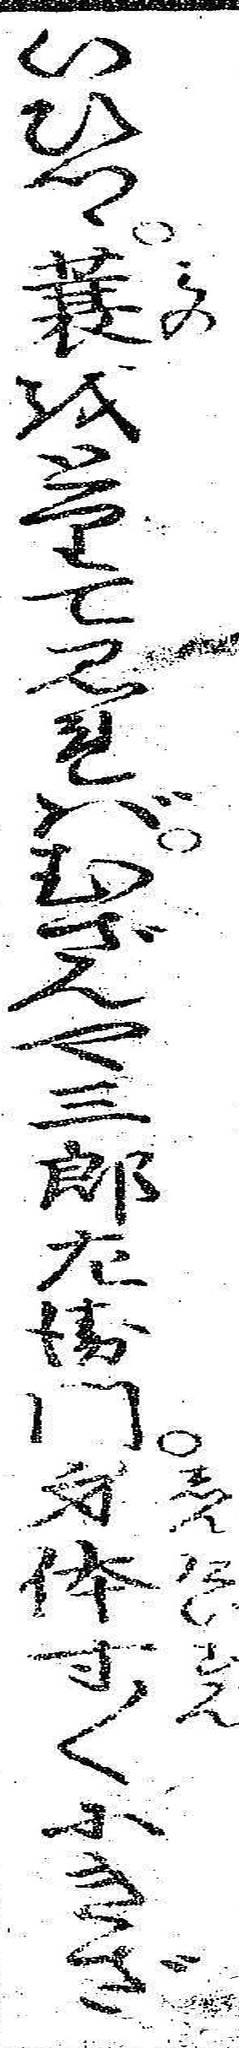いひつゝ。蓑をとりて見れば。むざんや三郎左衛門。身体寸々にきざ

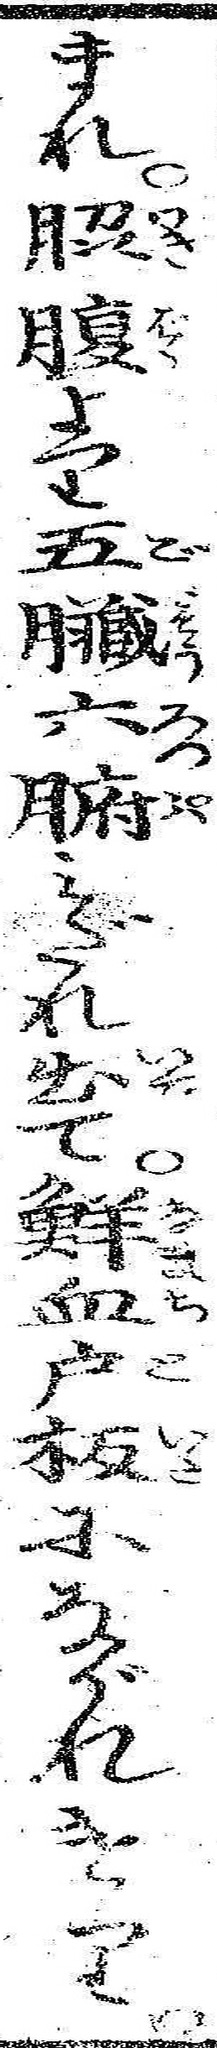まれ。脇腹より五臓六腑みだれ出て。鮮血戸板にながれけり。
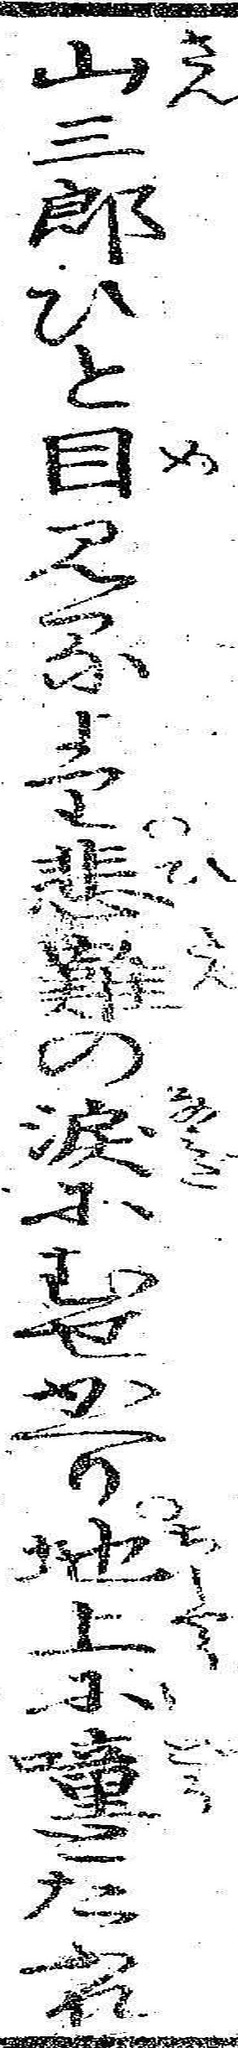山三郎ひと目見るより。悲難の涙にむせかへり。地上に噇とたふれ
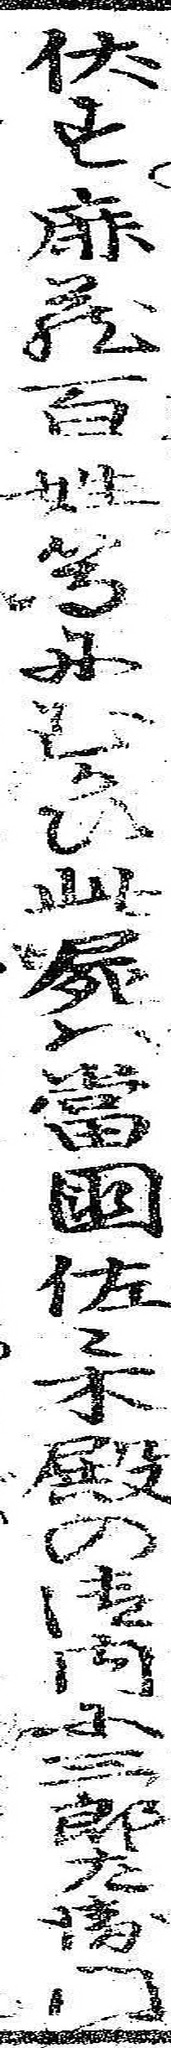伏す。鹿蔵百姓等にむかひ。此屍は当国佐々木殿の御内に三郎左衛門
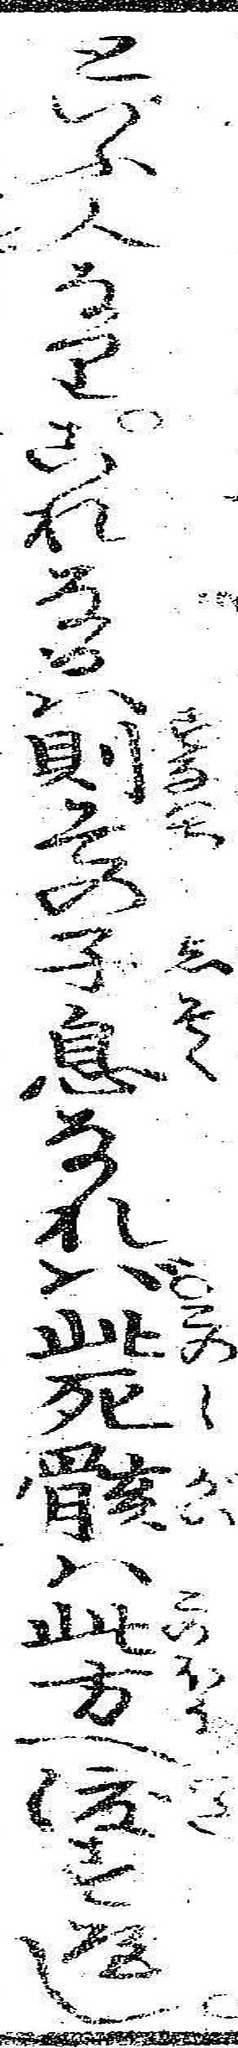といふ人なり。これなるは則その子息なれば。此死骸は此方へ渡すへし。
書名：昔話稲妻表紙
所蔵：国文学研究資料館
